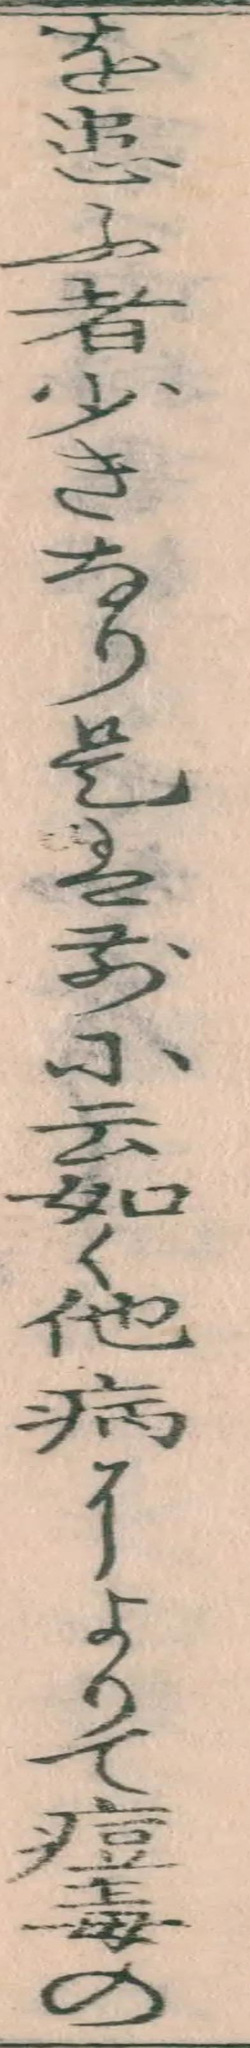を患ふ者少きなり是は前に云如く他病によりて痘毒の
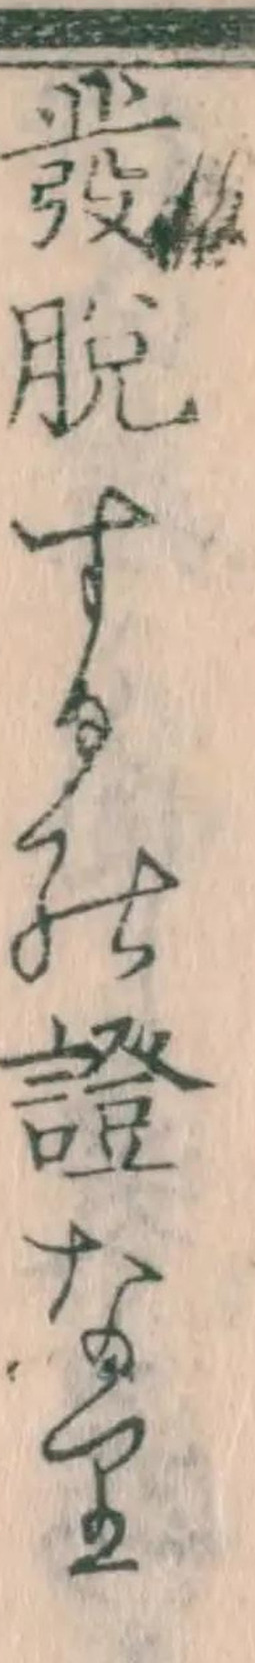發脱するの證なり
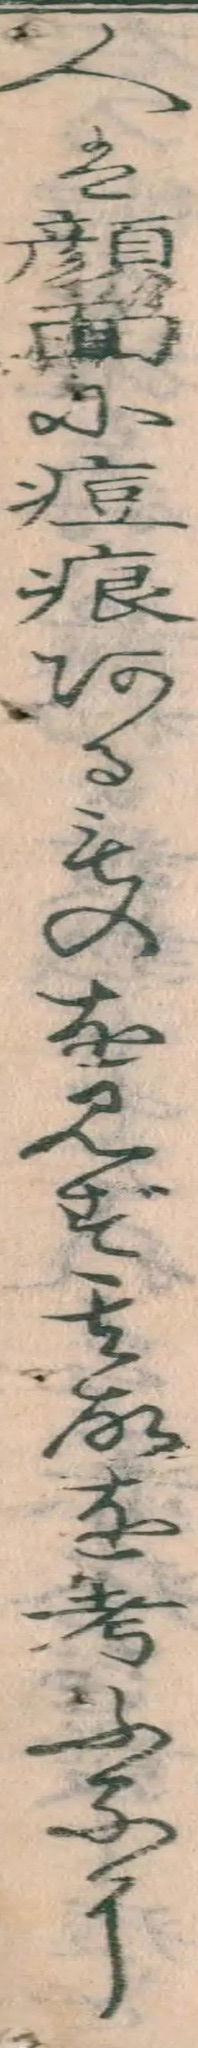人は顔面に痘痕あるものを見ず其故を考ふなり
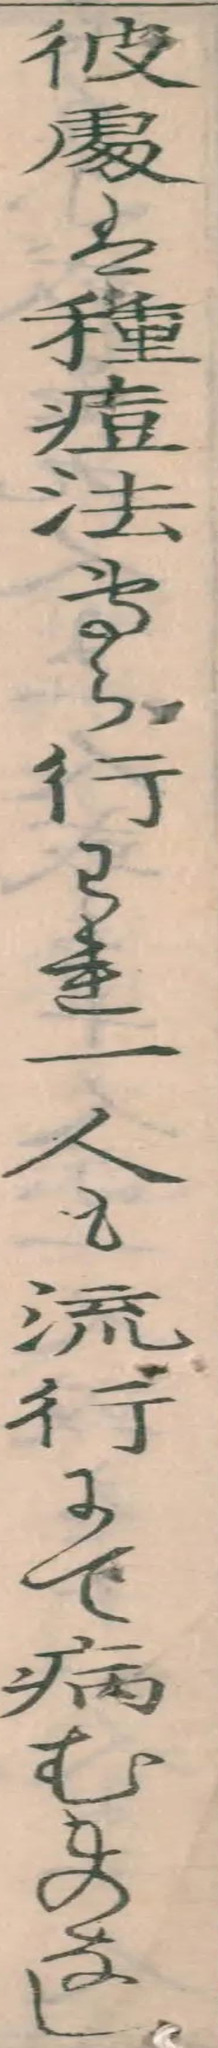彼處は種痘法専ら行われ一人も流行にて病むものなし
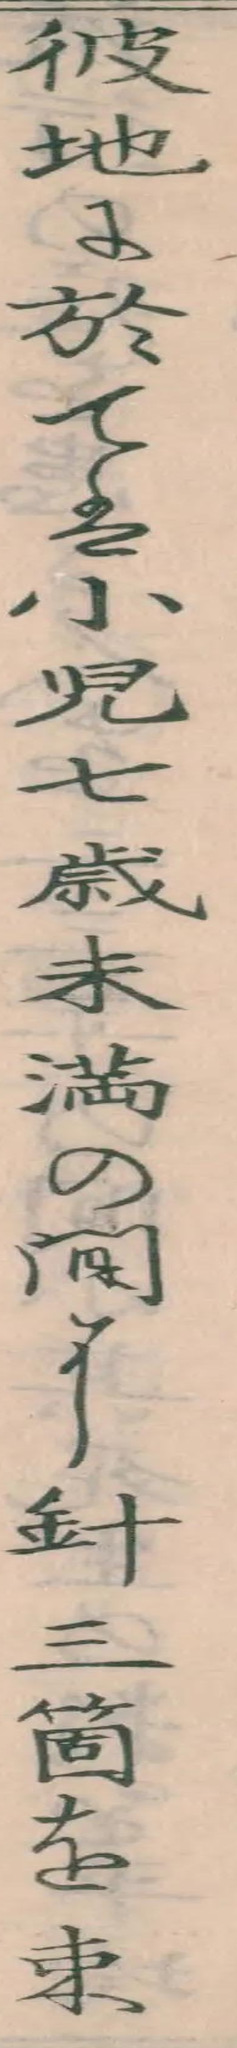彼地に於ては小児七歳未満の間に針三箇を束
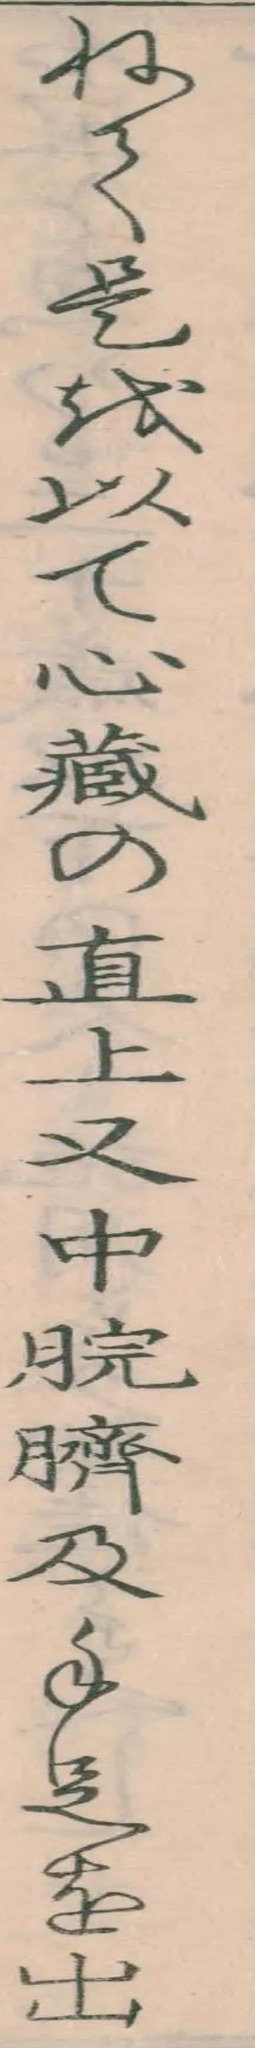ねて是を以て心蔵の真上又中脘臍及て是を出
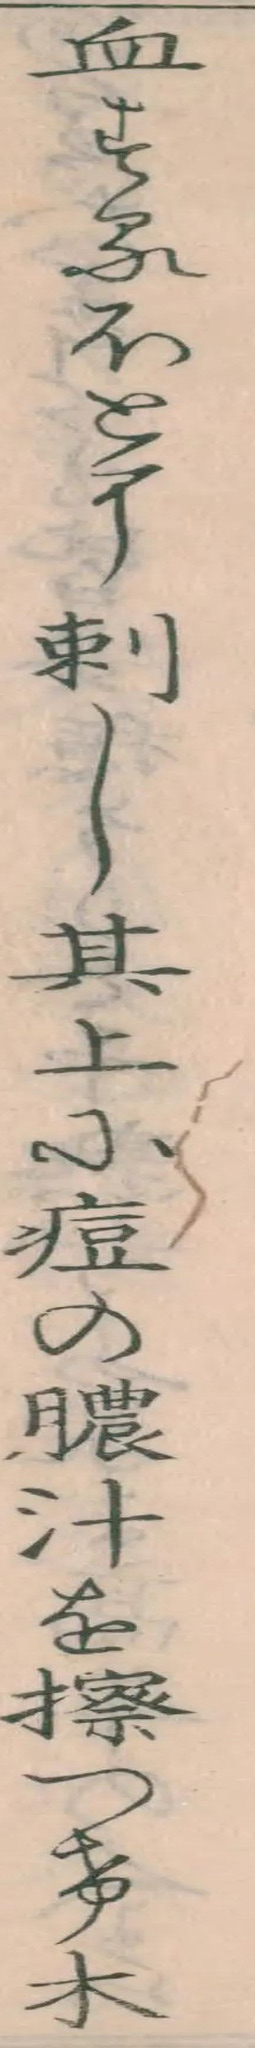血すれほに刺し其上に痘の膿汁を擦つけ木
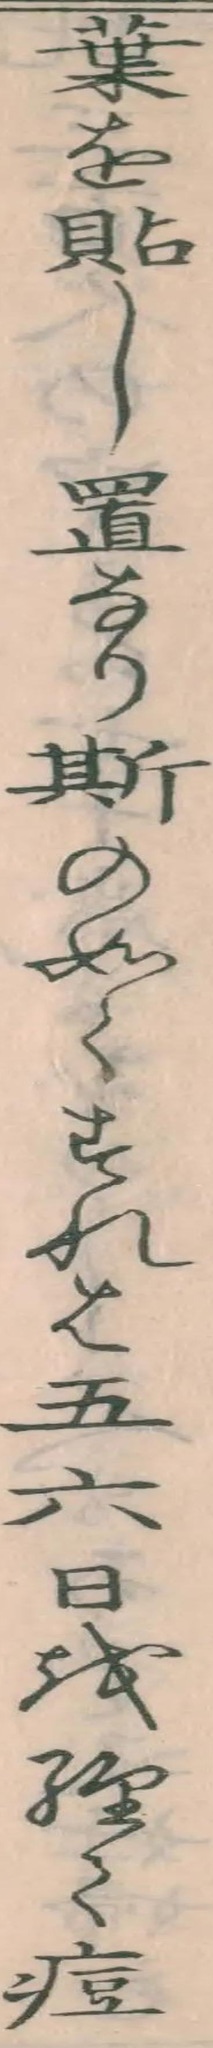葉を貼し置なり斯の如くそれは五六日を経て痘
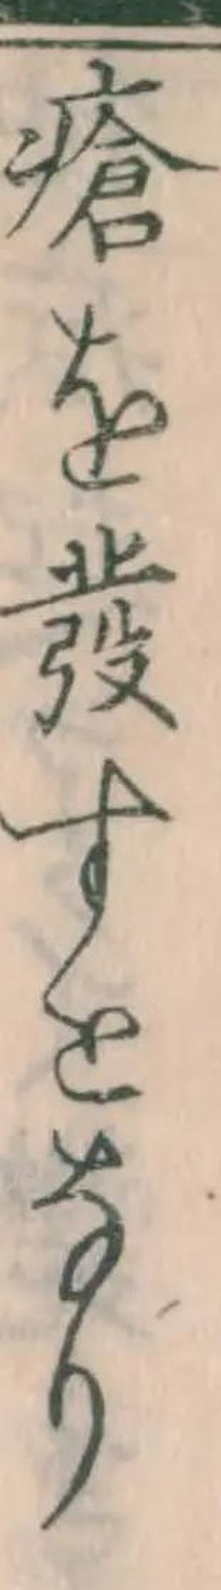瘡を發すとなり
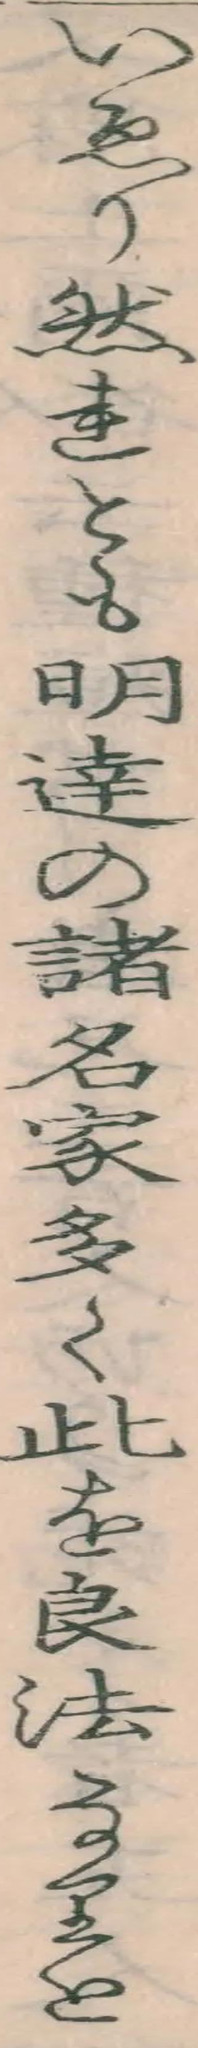いゑり然れとも明達の諸名家多く此を良法なりと
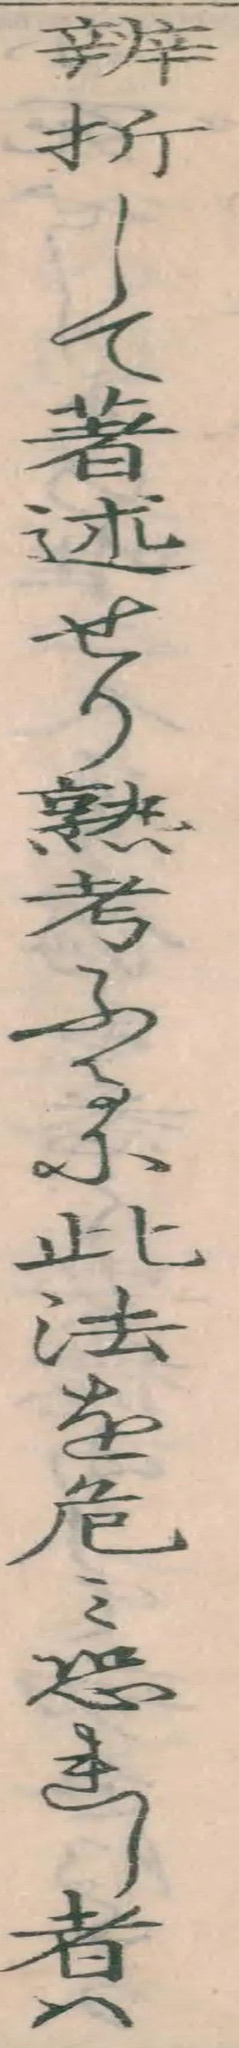辨折して著述せい熟考ふるに此法を危み恐れし者は
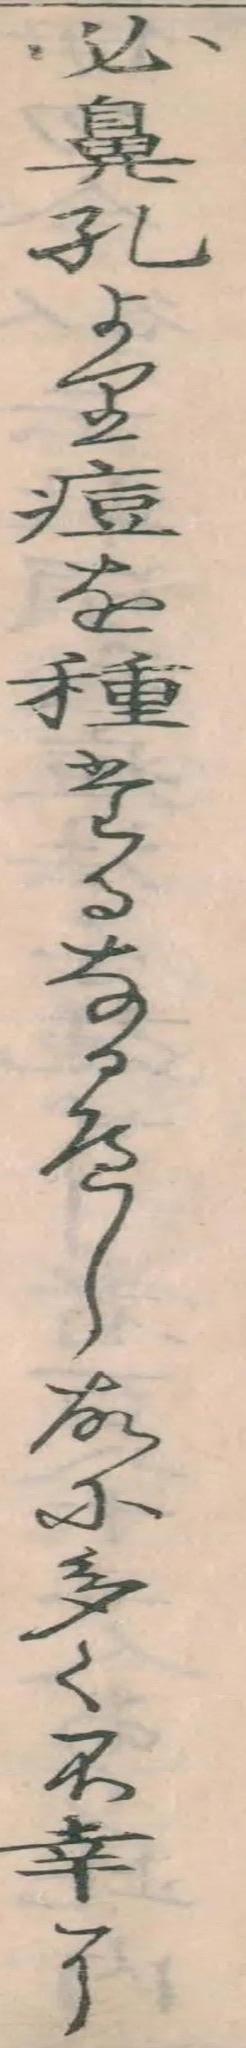必鼻孔より痘を種たるなるへし故に多く不幸に
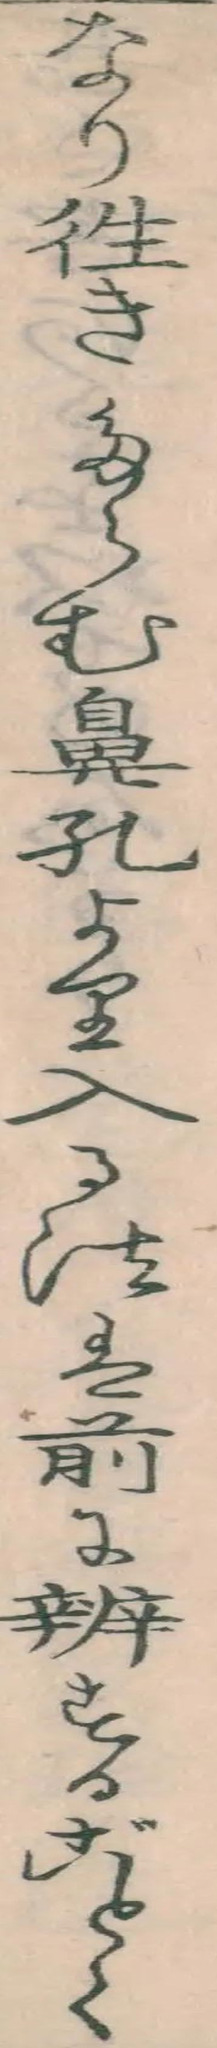なり往きたらむ鼻孔より入る法は前に辨するごとく

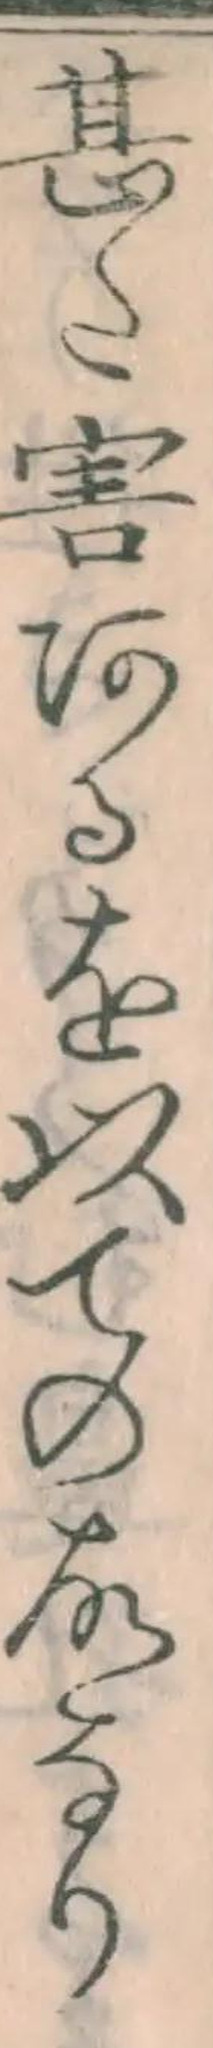甚た害あるを以ての故なり
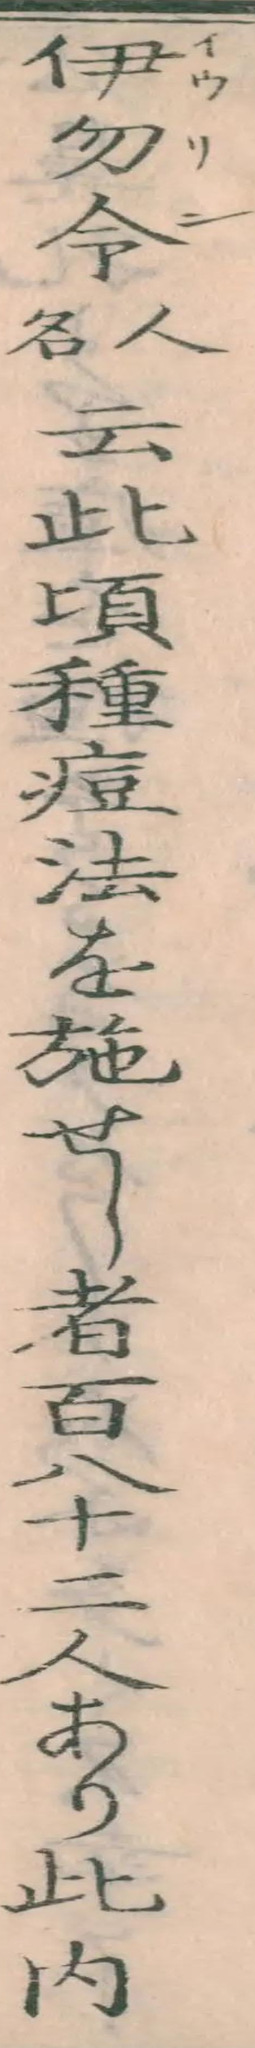伊勿令人名云此頃種痘法を施せし者百八十二人あり此内
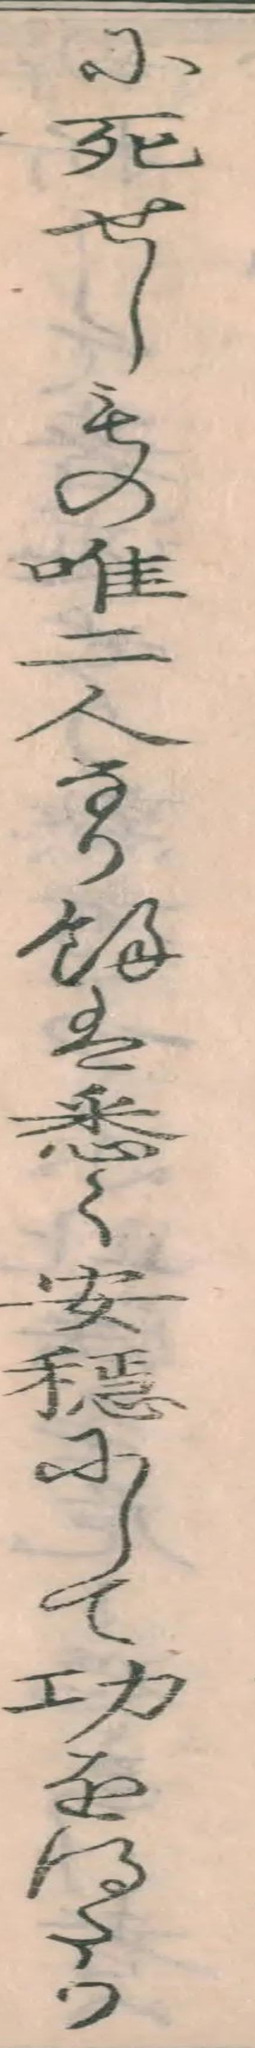に死せりもの唯二人なり餘は悉く安穏にして功を得たり
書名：種痘新編
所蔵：国立国会図書館 National Diet Library, JAPAN
